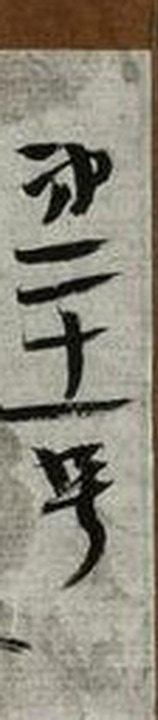第二十一号
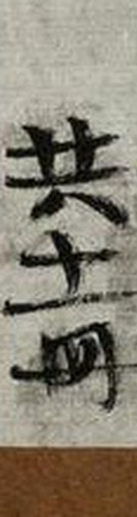共十一冊
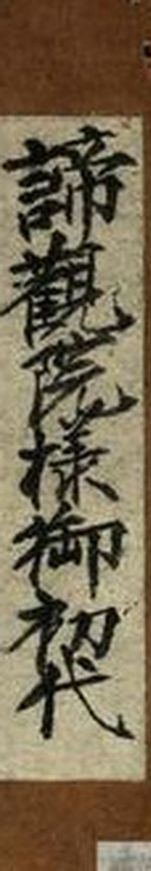諦観院様御初代
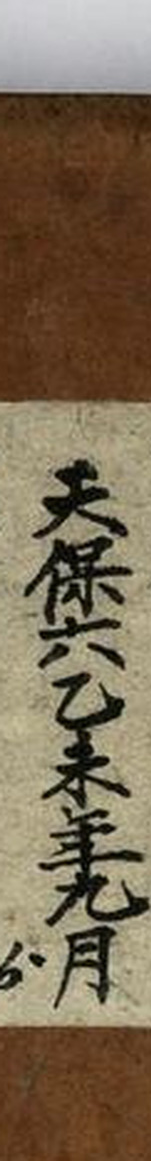天保六乙未年九月ゟ
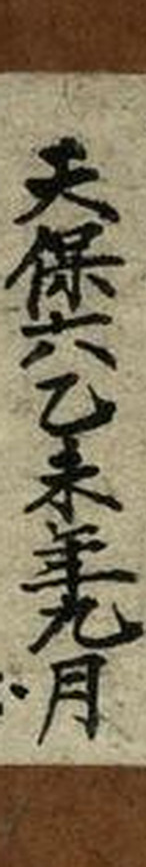天保六乙未年九月ゟ
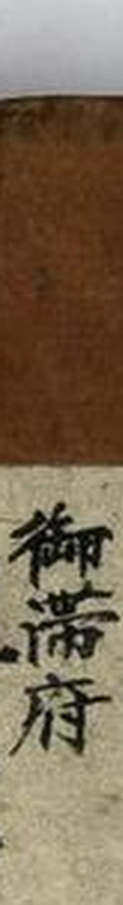御滞府
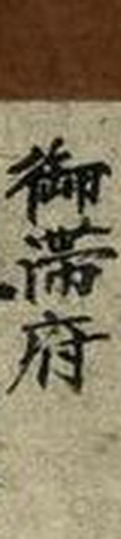御滞府
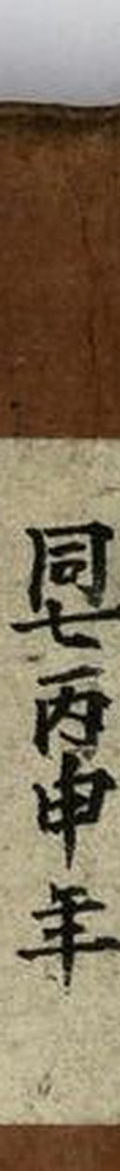同七丙申年
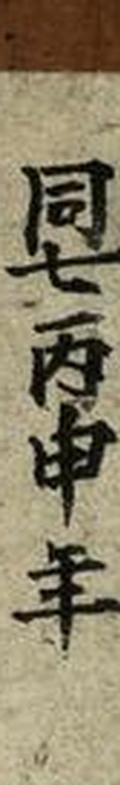同七丙申年
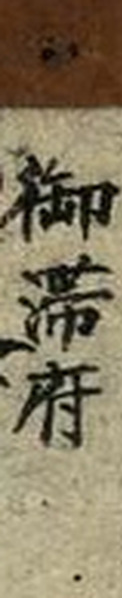御滞府
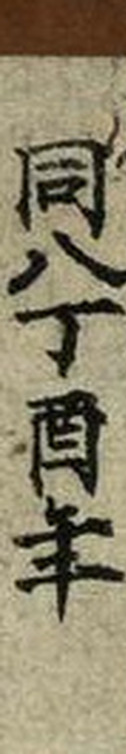同八丁酉年
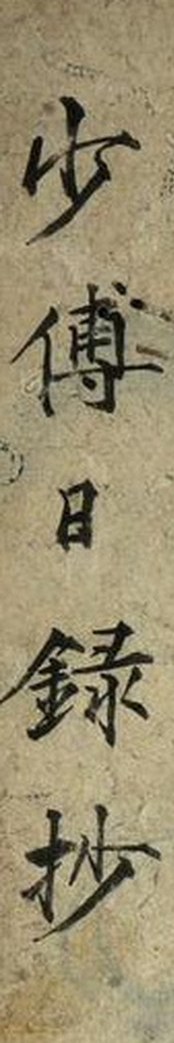少傅日録抄

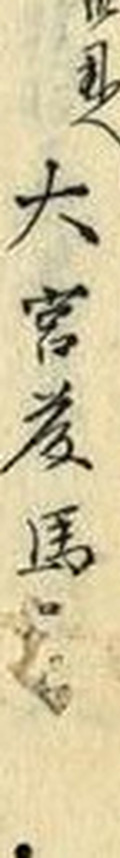大宮藤馬
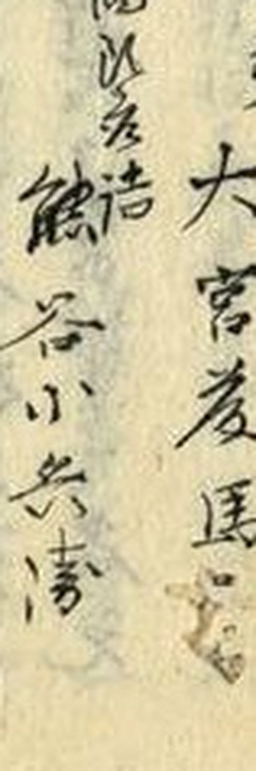熊谷小兵衛
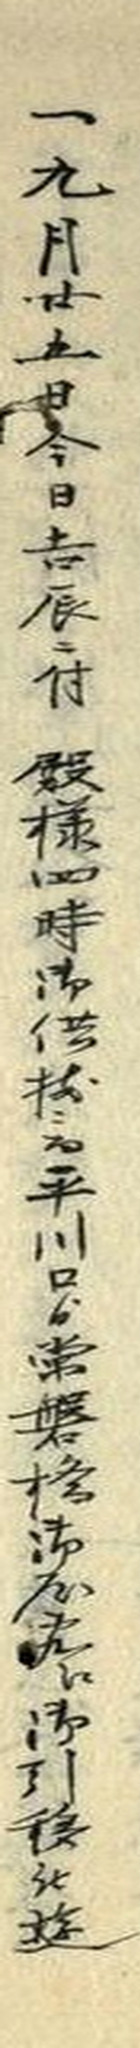一九月廿五日今日吉辰ニ付殿様四時御供揃ニ而平川口ゟ常磐橋御屋敷江御引移被遊
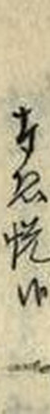奉恐悦候
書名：少傅日録抄（斉善付側向頭取日記、在府）
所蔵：福井県文書館 Fukui Prefectural Archives
